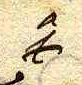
4a
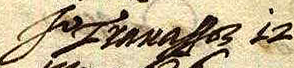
Jo Trauassos i2
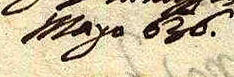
mayo 636.
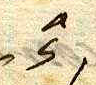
5a
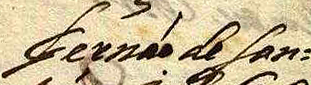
fernaõ de san
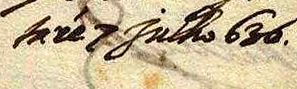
tarē 7 Julho 636.
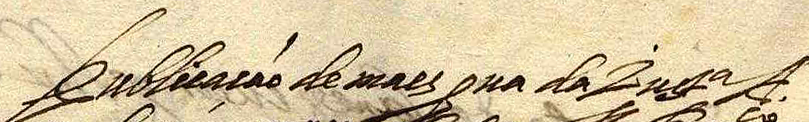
Publicação de maes ꝓua da Iust.a A.
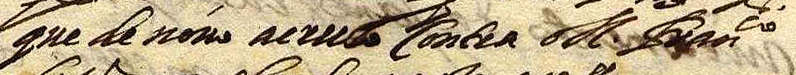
que de nouo acreceo Contra o R. Franco
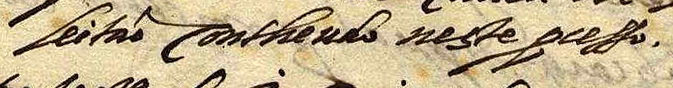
Leitaõ Contheudo neste ꝓcesso.
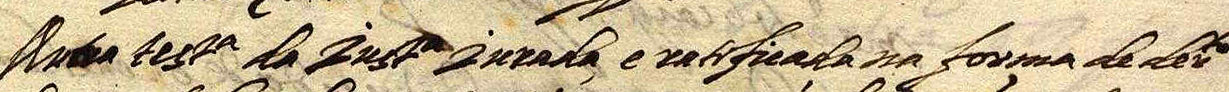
Outra testa da Iusta Iurada, e ratificada na forma de derto
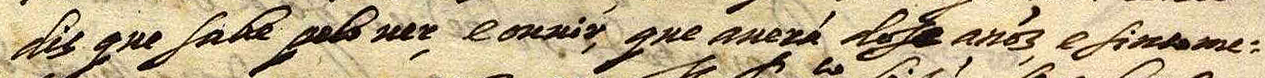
dis que sabe pelo uer, e ouuir, que auerá dose anōs, e sinco me
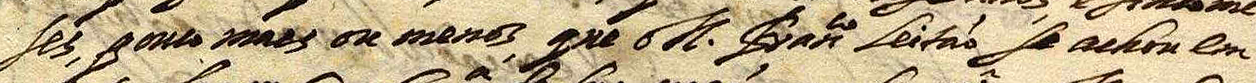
ses, pouco mais ou menos, que o R. Franco Leitaõ se achou em
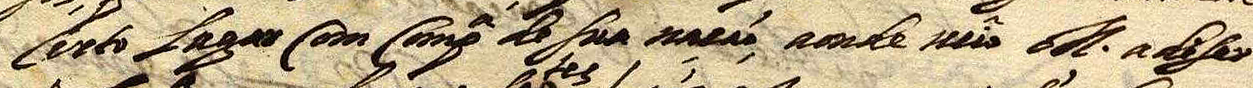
Certo Lugar Com Compa de sua naçaõ, aonde ueio o R. a diser
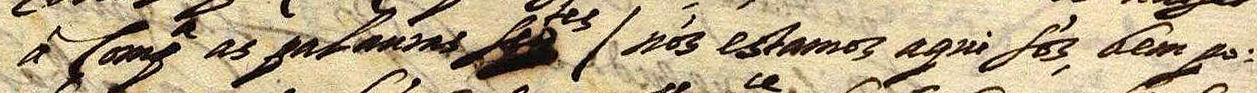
á Compa as palauras segtes / nós estamos aqui sós, bem po
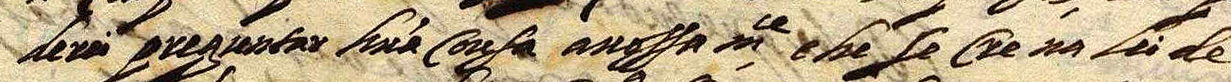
derao preguntar huā cousa a uossa mce, e he se cre na Lei de
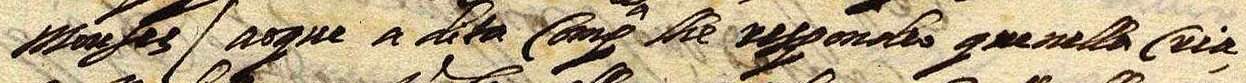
mouses / ao que a dita Compa lhe respondeo que nella cria,
